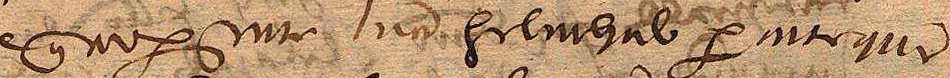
e q̄ ao ꝑsente nā he lenbrado ꝑante quē
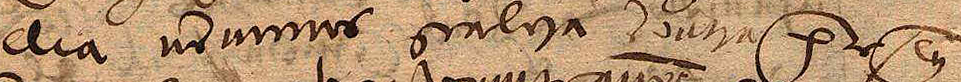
llia nē menos se a lera ē outra p̄te / e q̄
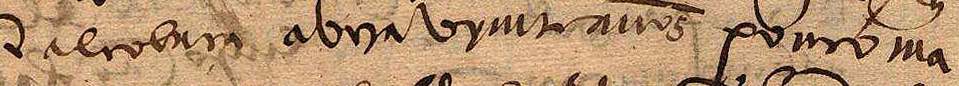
ē alcobaça avera vymte an̄os pouco ma
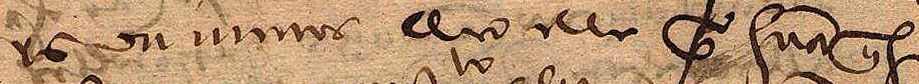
ys ou menos lleo elle p̄o huā q̄ hy
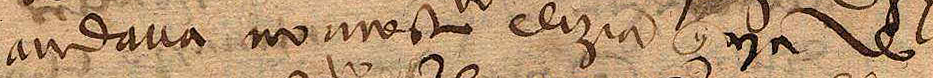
andaua no mostro e diziā q̄ era do
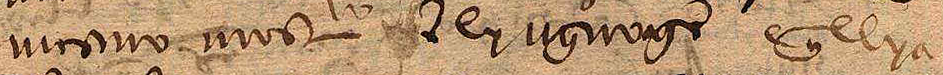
mesmo mostro ē lynguoagē e q̄ llya
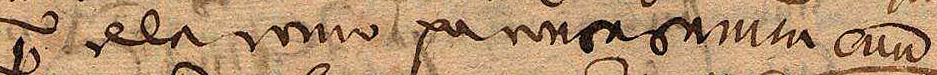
p̄o ella como por cousa samta q nā
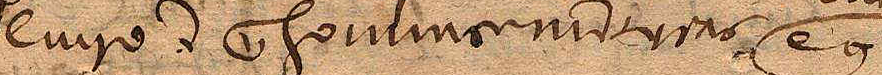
liuro ē q̄ houuese mētyras e q̄
